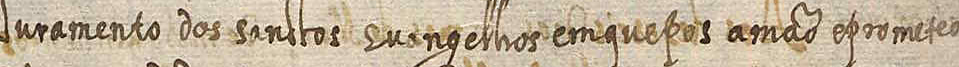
Iuramento dos sanctos Euangelhos em que pos a mão e prometeo
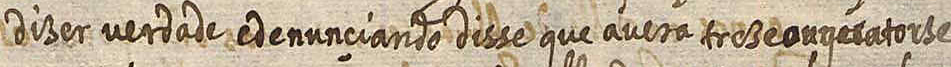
dizer uerdade e denunçiando disse que auera treze ou quatorze
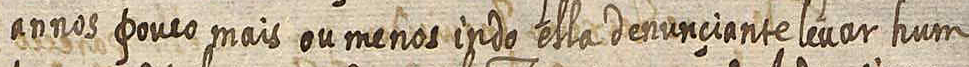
annos pouco mais ou menos indo ella denunçiante leuar hum
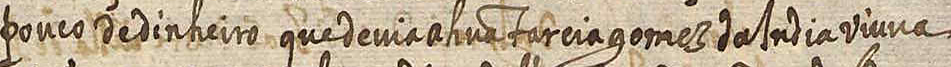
pouco de dinheiro que deuia a huā Tareia gomez da India viuua
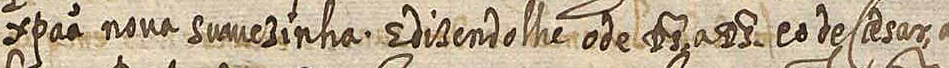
xpaā noua sua uezinha. E dizendolhe o de Ds̄ a Ds̄ e o de Cæsar, a
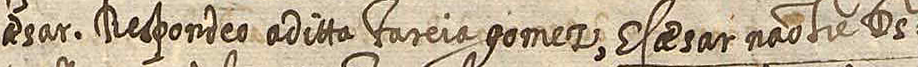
Cæsar. Respondeo a ditta Tareia gomez, E Cæsar não he D̄s.
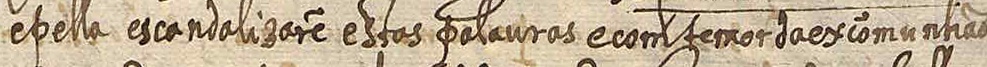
e pella escandalizarē estas palauras e com temor da excōmunhão
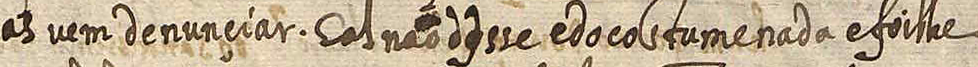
as uem denunçiar. E al não disse e do costume nada e foilhe
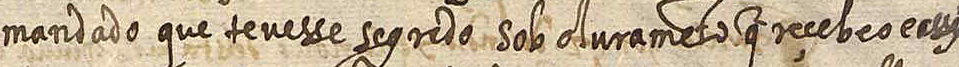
mandado que teuesse segredo sob o Iuramēto q̄ reçebeo e assy
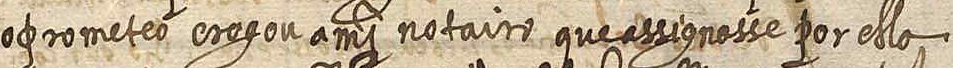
o prometeo e rogou a mj̄ notairo que assignasse por ella
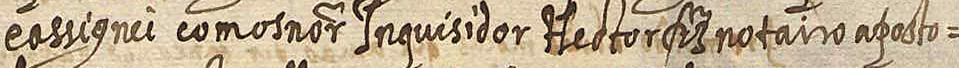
e assignei com o snor̄ Inquisidor Hector fr̄z notairo aposto
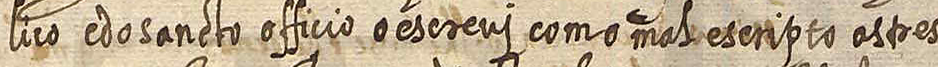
lico e do sancto officio o escreuj com o mal escripto as tres
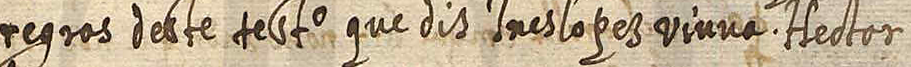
regras deste testo que dis Ines lopez viuua. Hector
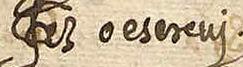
fr̄z o escreuvj.
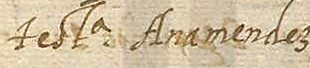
testa. Ana mendez
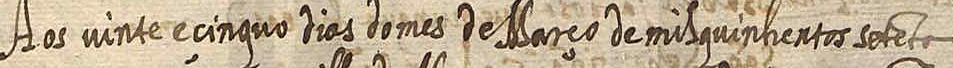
Aos uinte e çinquo dias do mes de Março de mil quinhentos setēta
